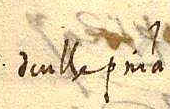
deulhe pniā
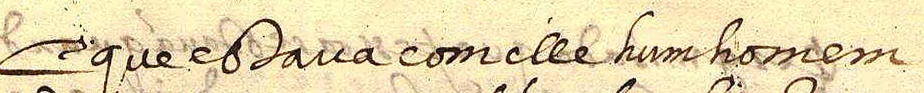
E que estaua com elle hum homem
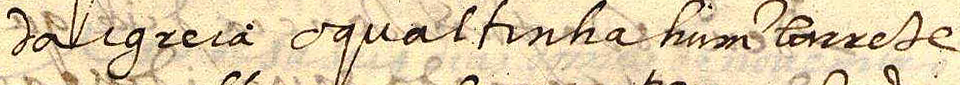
da igreia o qual tinha hum̄ barrete
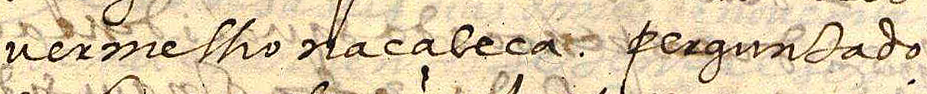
uermelho na cabeca. perguntado
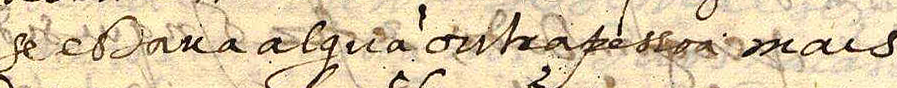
se estaua alguā outra pessoa mais
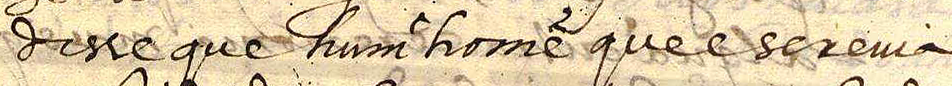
disse que hum̄ homē que escreuia
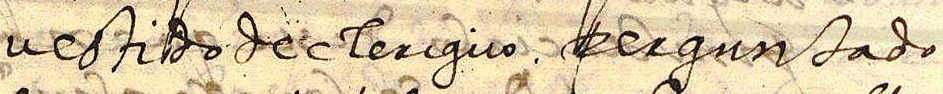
uestido de cleriguo. perguntado
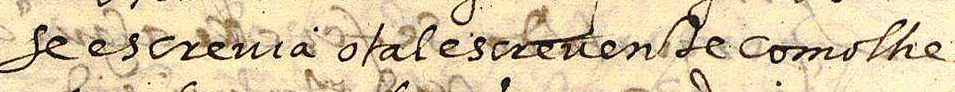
se escreuia o tal escreuente como lhe
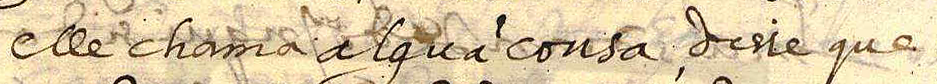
elle chama alguā cousa, disse que
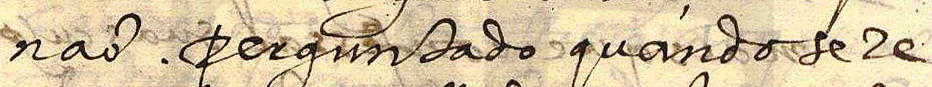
naõ. perguntado quando se re
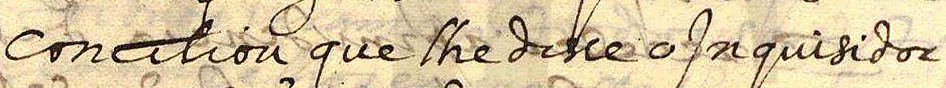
conciliou que lhe disse o Jnquisidor
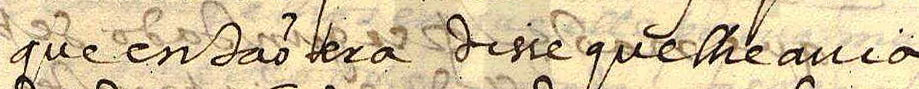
que entaõ era disse que lhe auia
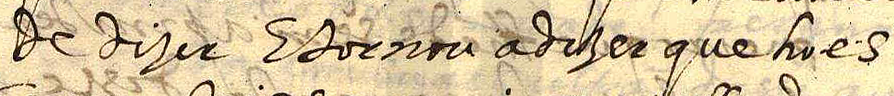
de dizer E tornou a dizer que ho es
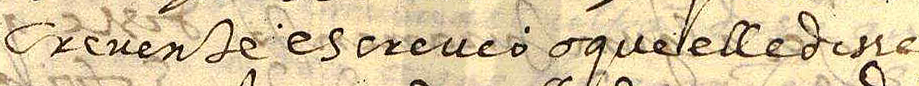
creuente escreueo o que elle disse
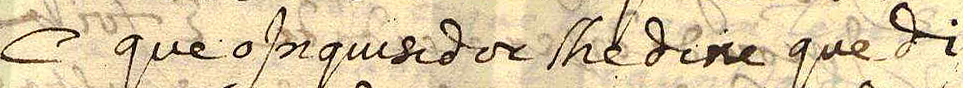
E que o Jnquisidor lhe disse que di
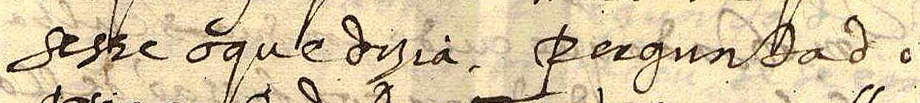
sesse o que dizia. perguntado
